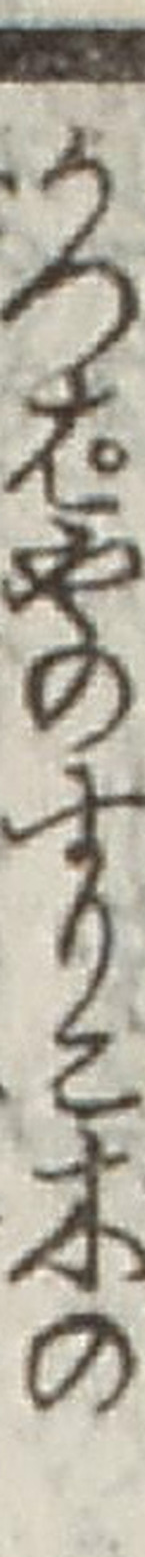かつぱやのすりこ木の
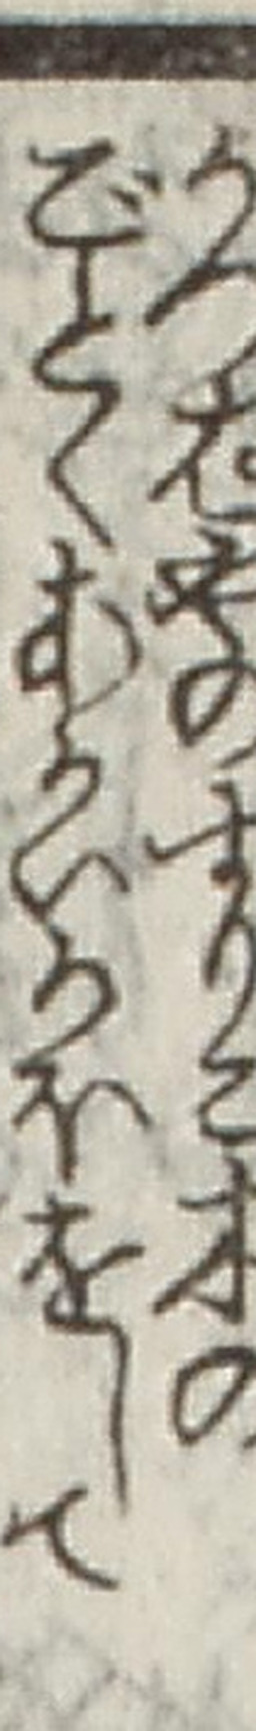ごとくあかいかほをして
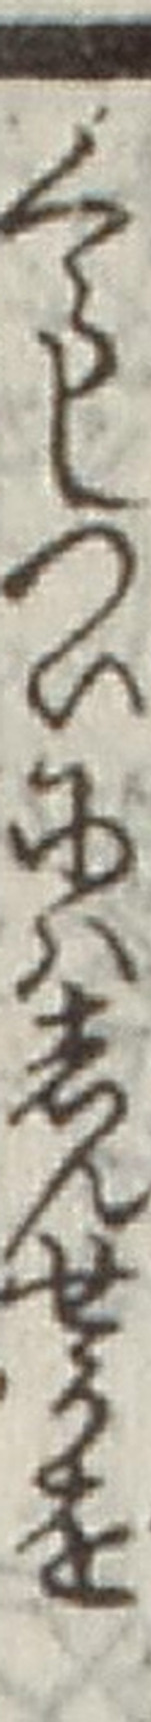くらしついにはしんせうを
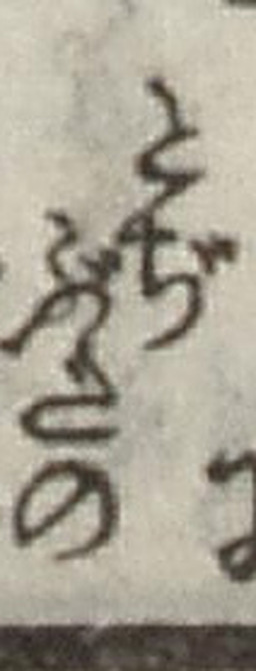ぶたの
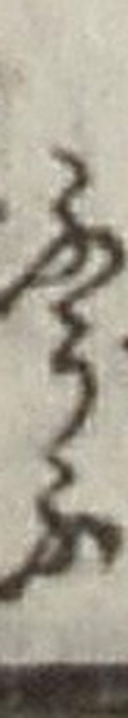ふうふ
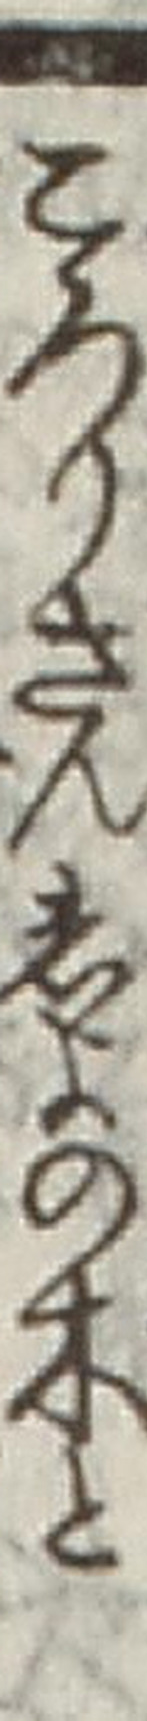ころりさんしょの木と
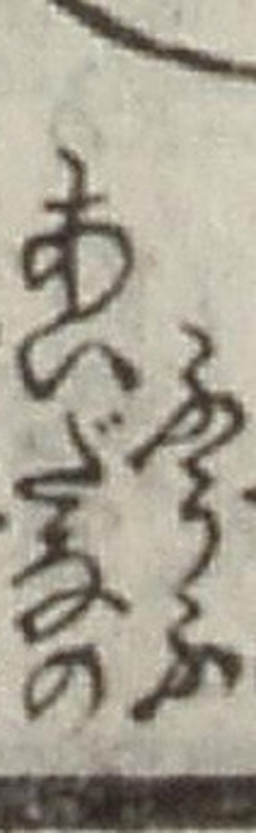あいだなの
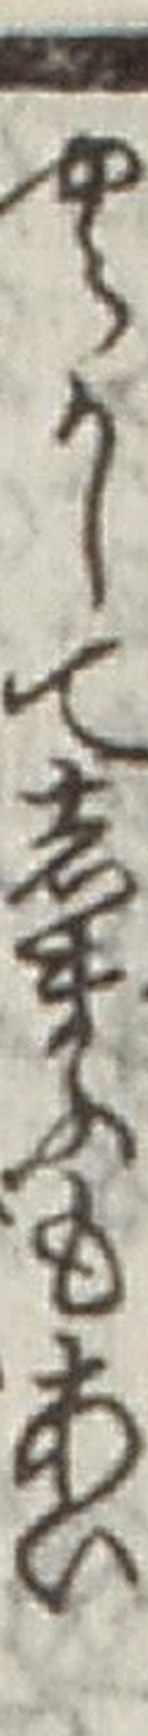やらかしてしまふもあい
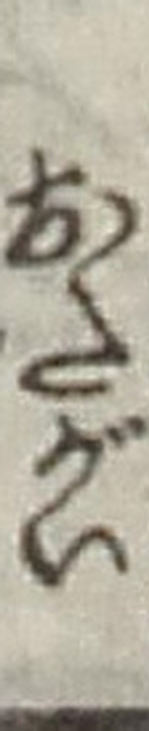おたがい
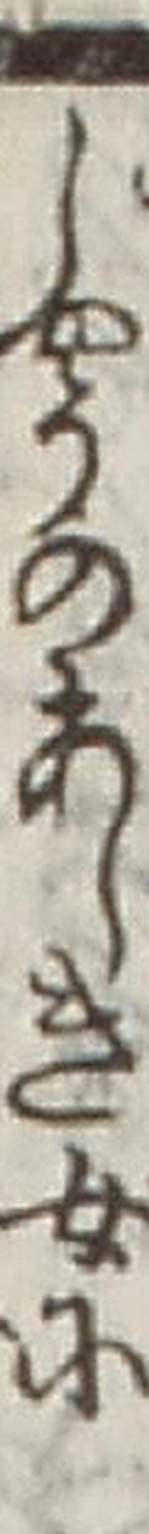しやうのあしき女に
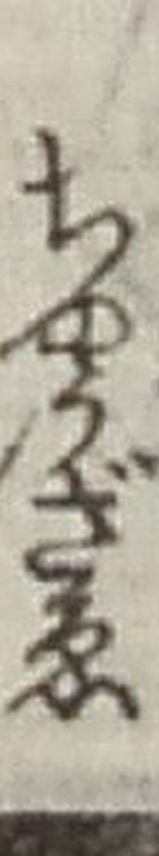ちやうざゑ
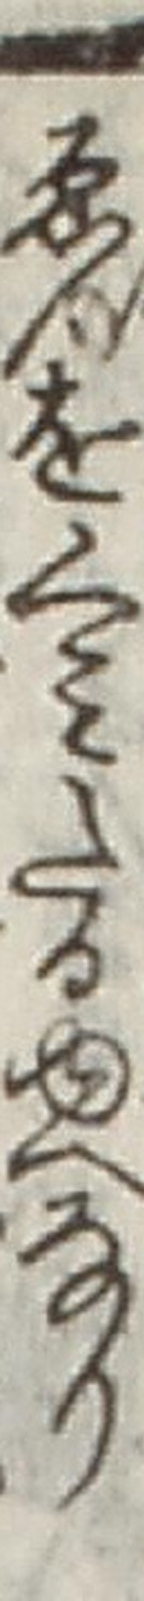ゑんをくみたるゆへなり
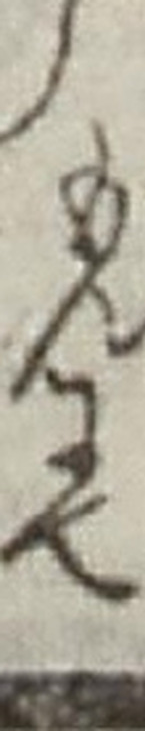もんにて
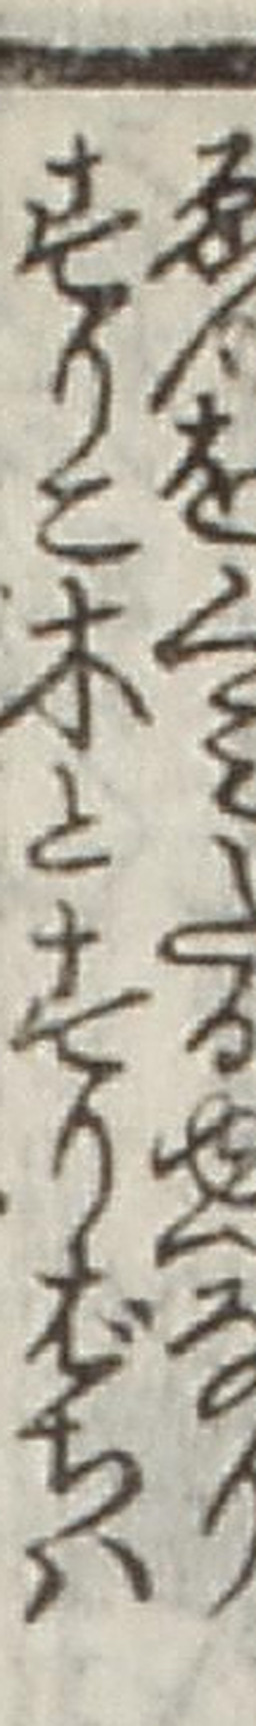すりこ木とすりばちは
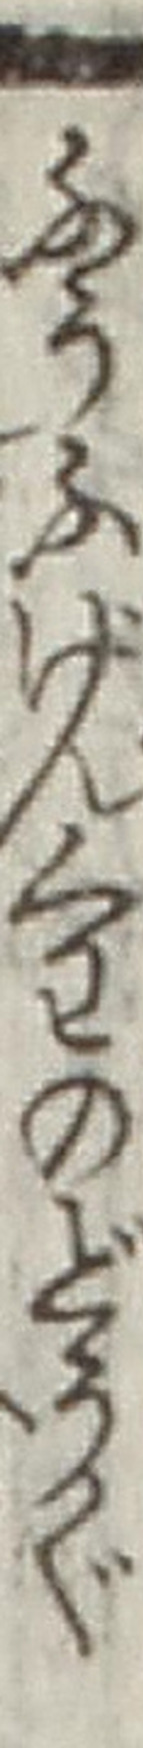ふうふけんくわのどうぐ
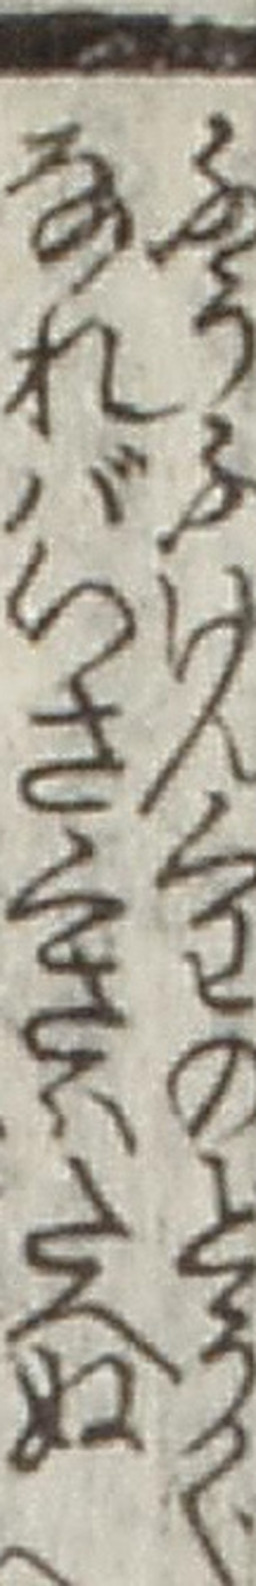なればいさこさはたへぬ
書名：三世相出雲當座帳　上下冊
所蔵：東京大学地震研究所図書室 Earthquake Research Institute Library, The University of Tokyo, JAPAN
